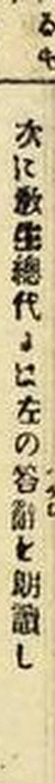次に教生惣代には左の答辞を朗読し
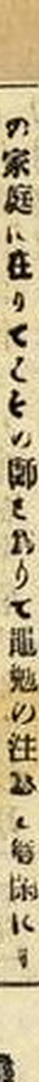の家庭に在りてはその師と為りて黽勉の注意を等閑にす
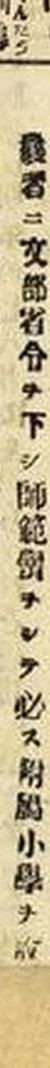最者ニ文部省令ヲ下シ師範校ヲシテ必ス附属小学ヲ設
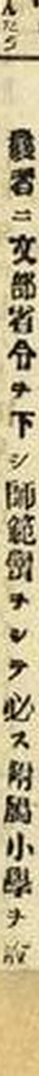最者ニ文部省令ヲ下シ師範校ヲシテ必ス附属小学ヲ設
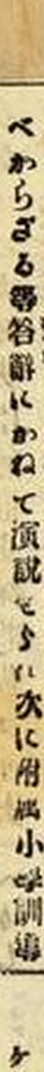べからざる等答辞にかねて演説せられ次に附属小学訓導
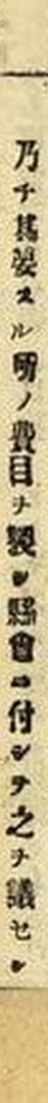乃チ其要スル所ノ費目ヲ製シ県会ニ付シテ之ヲ議セシ
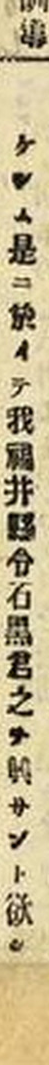ケシム是ニ於イテ我福井県令石黒君之ヲ興サント欲シ
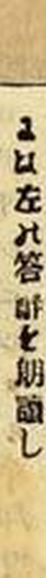には左の答辞を朗読し
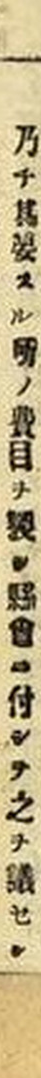乃チ其要スル所ノ費目ヲ製シ県会ニ付シテ之ヲ議セシ
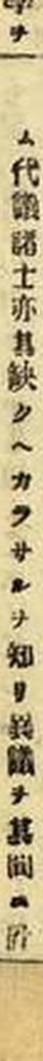ム代議諸士亦其欠クヘカラサルヲ知リ異議ヲ其間ニ置
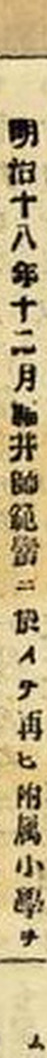明治十八年十二月福井師範校ニ於イテ再ヒ附属小学ヲ
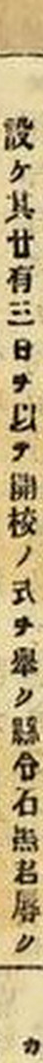設ケ其廿有三日ヲ以テ開校ノ式ヲ挙ク県令石黒君辱ク
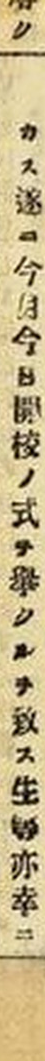カズ遂ニ今月今日開校ノ式ヲ挙クルヲ致ス生等亦幸ニ
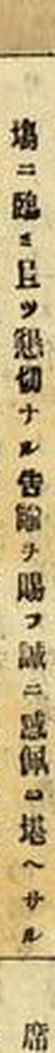場ニ臨ミ且ツ懇切ナル告諭ヲ賜フ誠ニ感佩ニ堪ヘサル
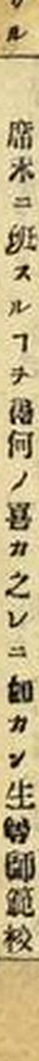席末ニ班スルヿヲ得何ノ喜カ之レニ如カン生等師範校
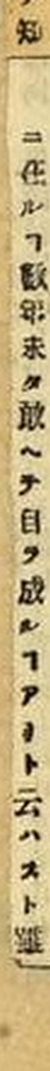ニ任ルヿ数年未タ敢ヘテ自ラ成ルヿアリト云ハスト雖
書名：温古集 五巻
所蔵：福井県文書館 Fukui Prefectural Archives
